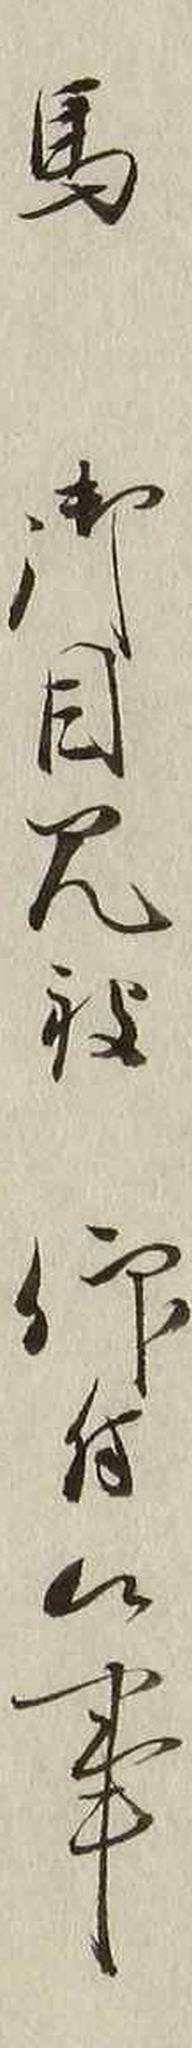馬御目見被仰付候事
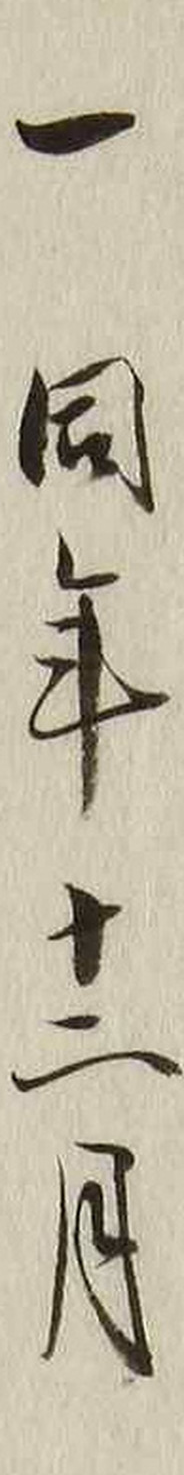一同年十二月
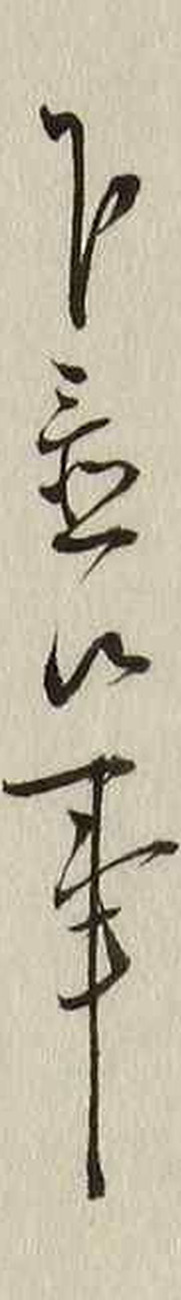下置候事
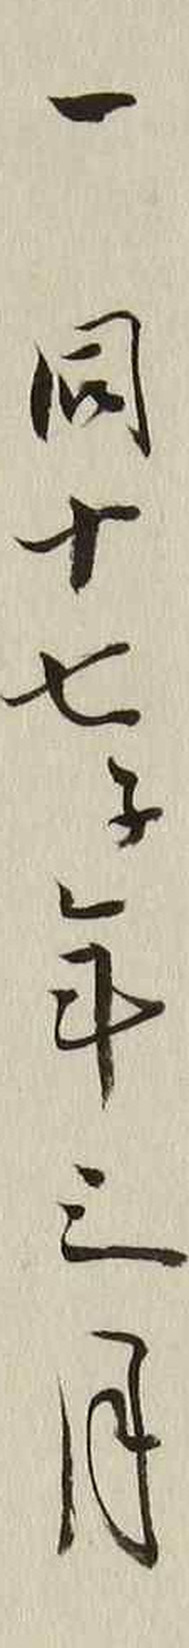一同十七子年三月
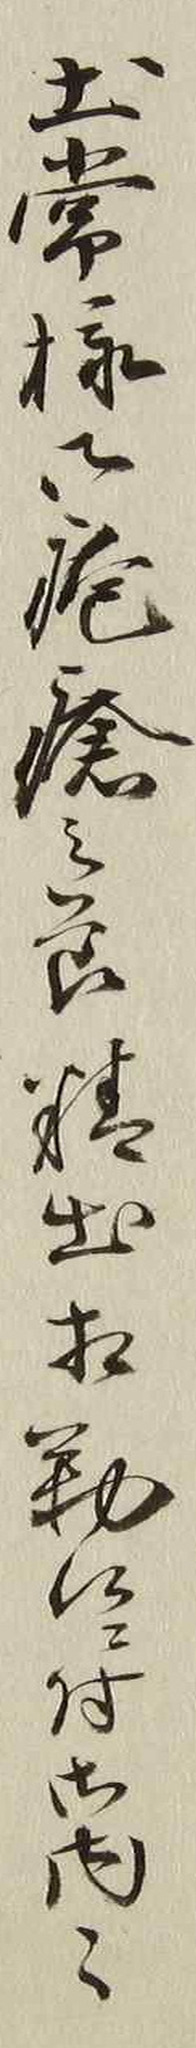土常様御疱瘡之節精出相勤候ニ付御内々
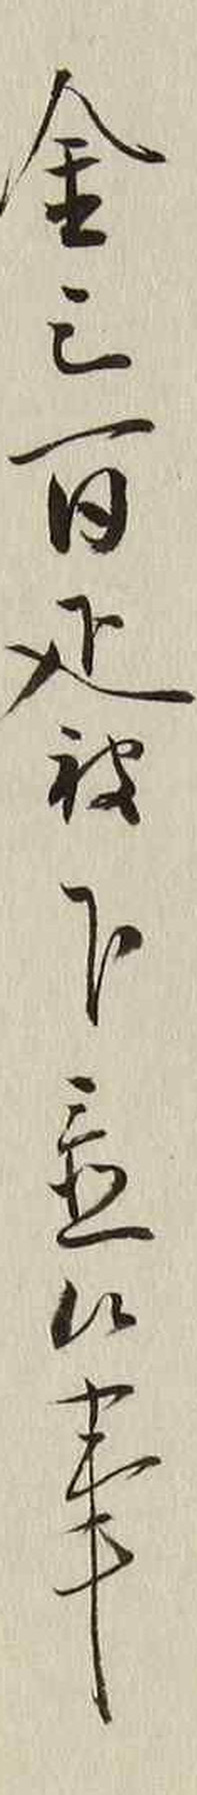金三百疋被下置候事
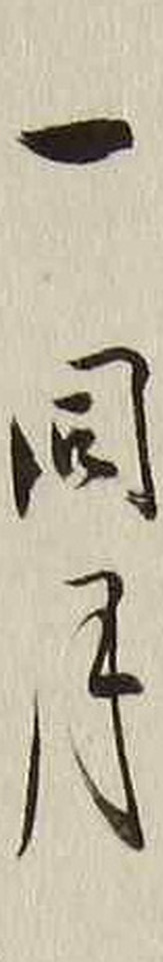一同月
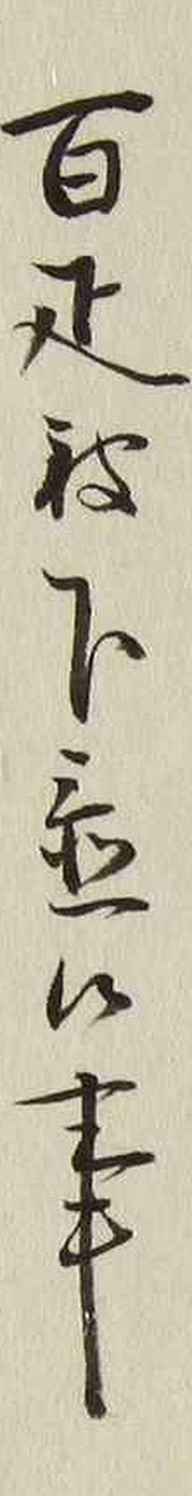百疋被下置候事
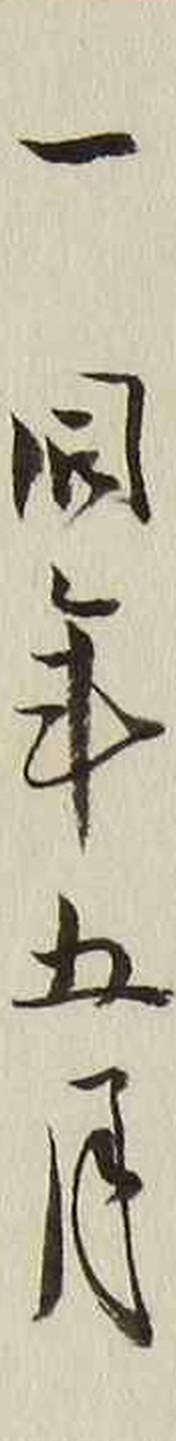一同年五月
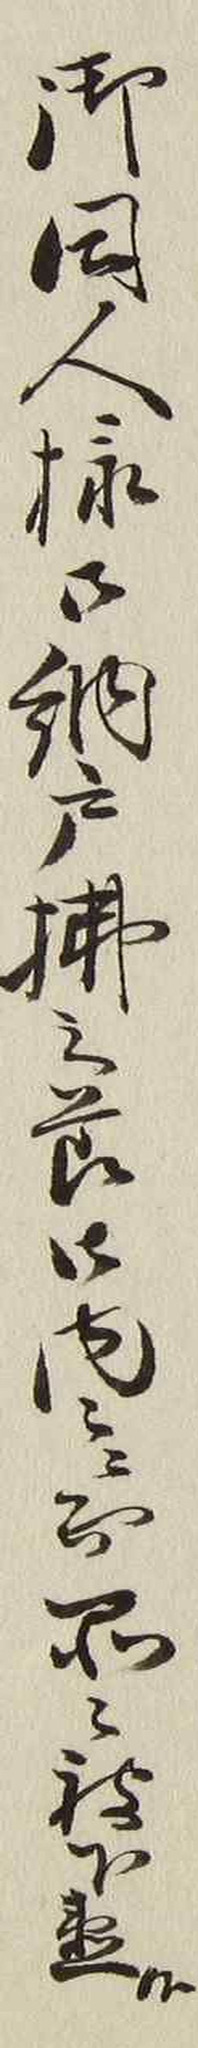御同人様御納戸払之節御内々ニ而品々被下置候
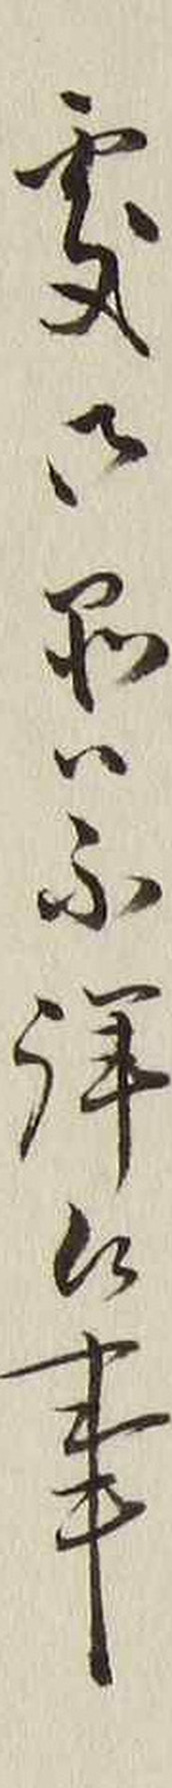処御品は不詳候事
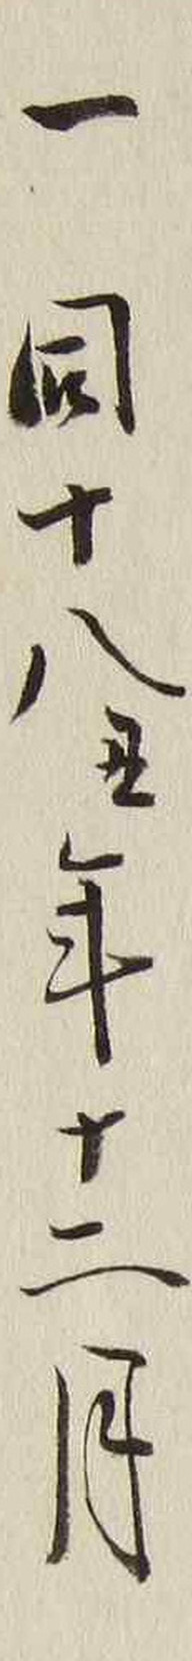一同十八丑年十二月
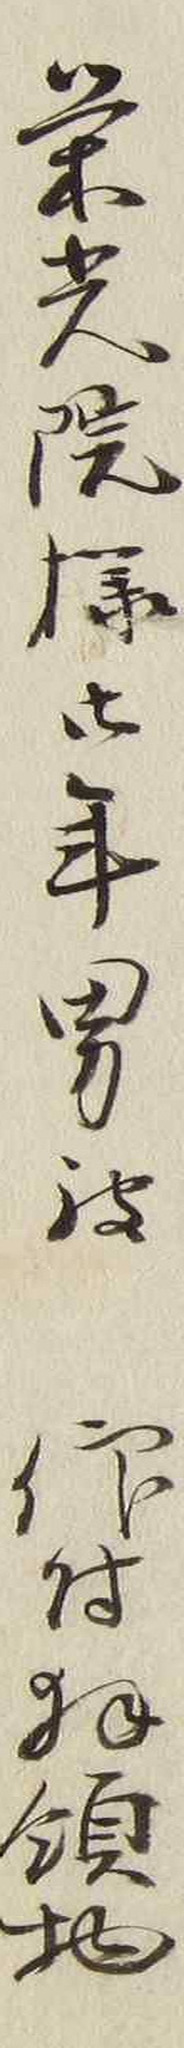栄光院様御年男被仰付拝領物

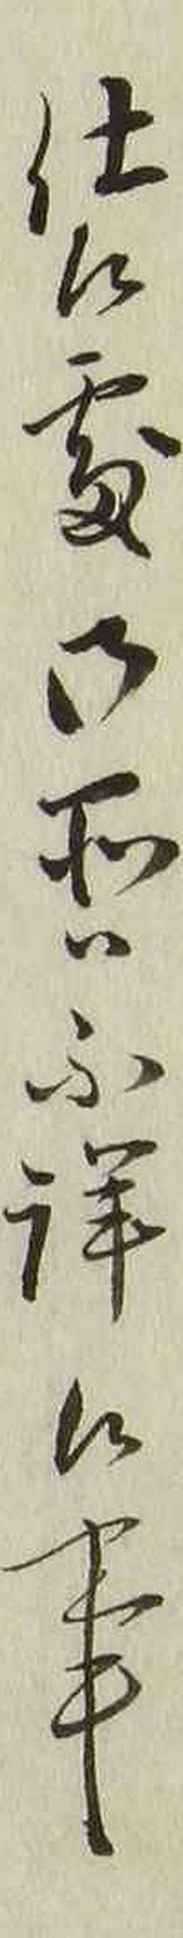仕候処御品は不詳候事
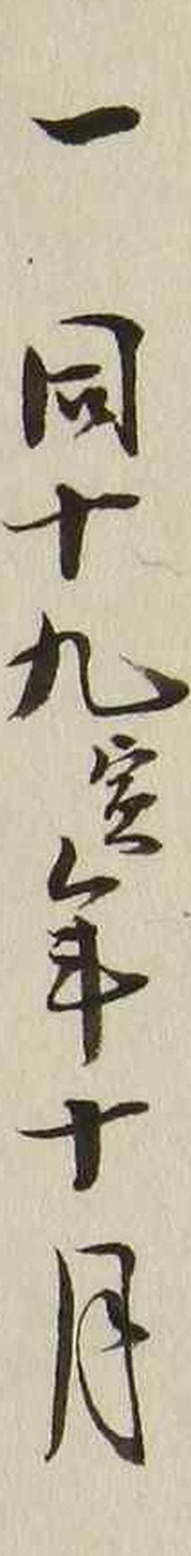一同十九寅年十月
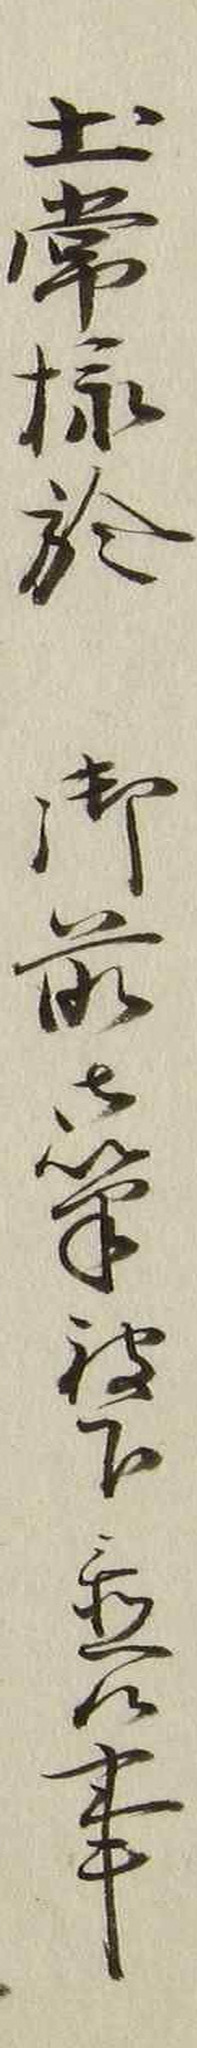土常様於御前御筆被下置候事
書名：諸士系譜　巻之163　な之部5
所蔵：会津若松市立会津図書館
